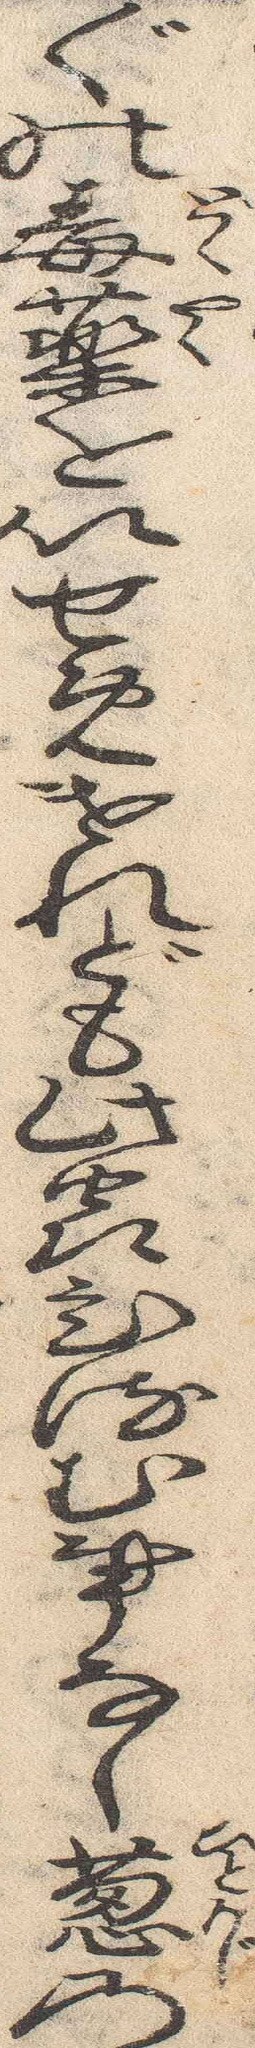〴〵の毒薬を以せめけれども此虫ひるむ事なし葱の
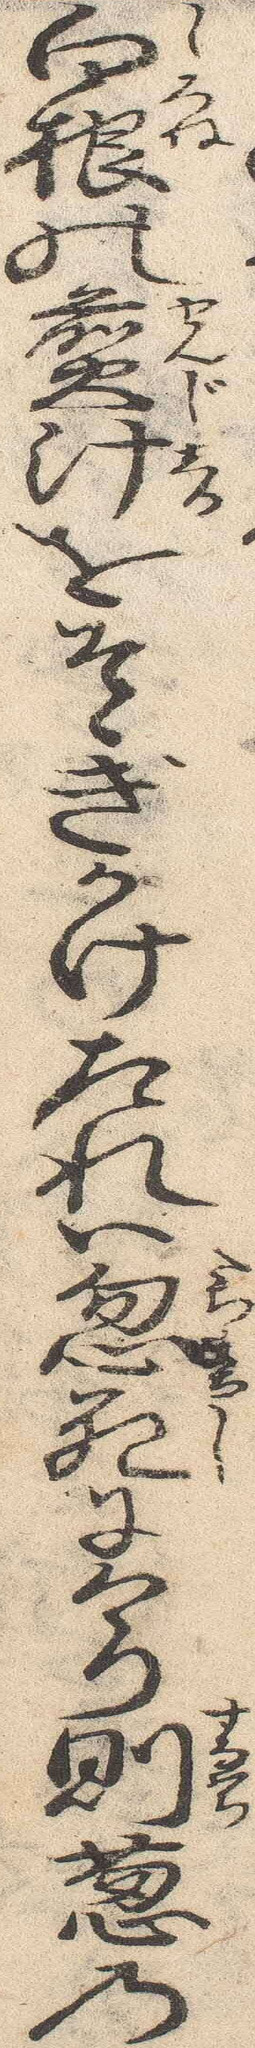白根の煎汁をそゝぎかけたれは忽死にけり則葱の
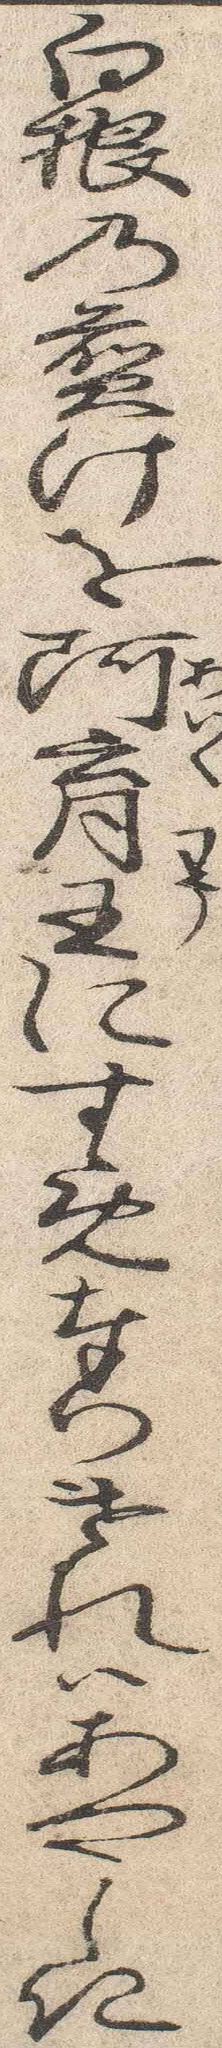白根の煎汁を阿育王にすゝめ奉りけれはあやしき
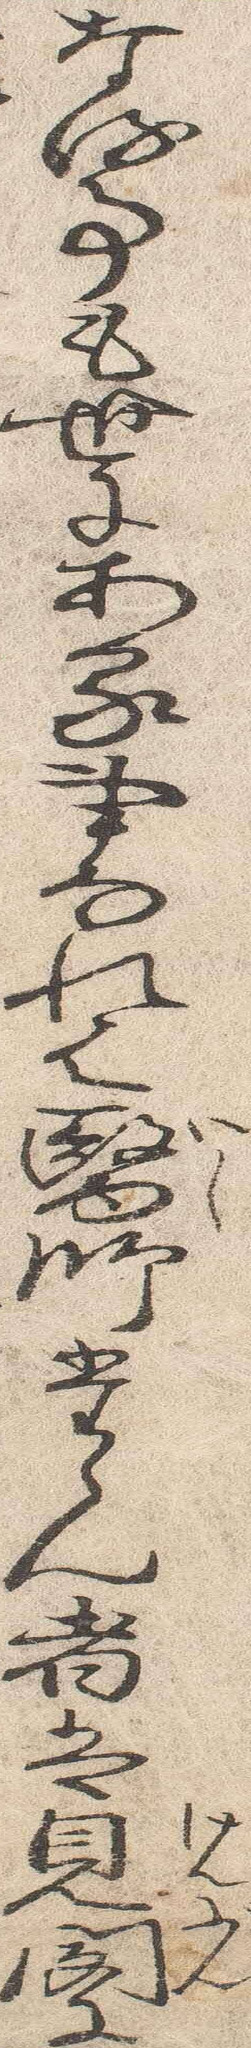なる事も世にあること事なれは医師たらん者は見聞に
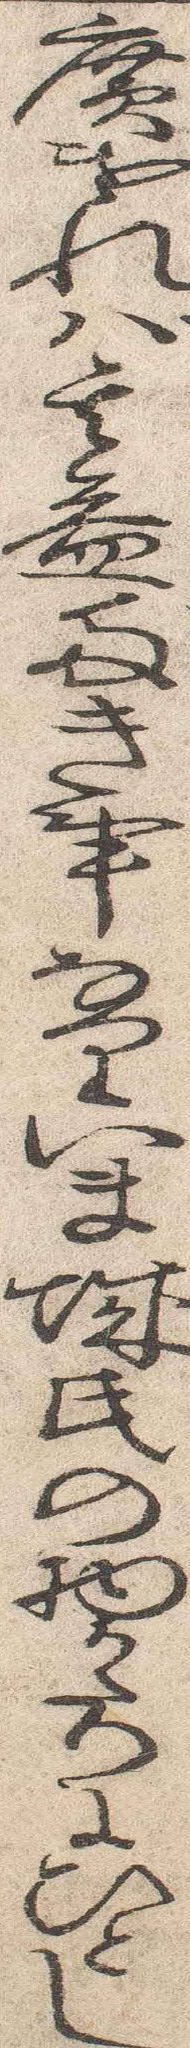広ければ其益多き事なりいま城氏の物かたりにひとし
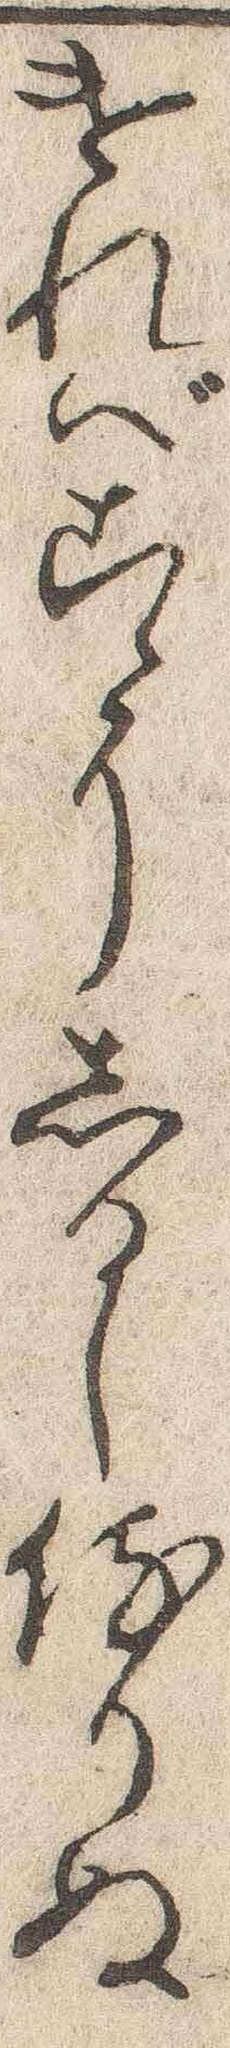ければこゝにしるし侍りぬ
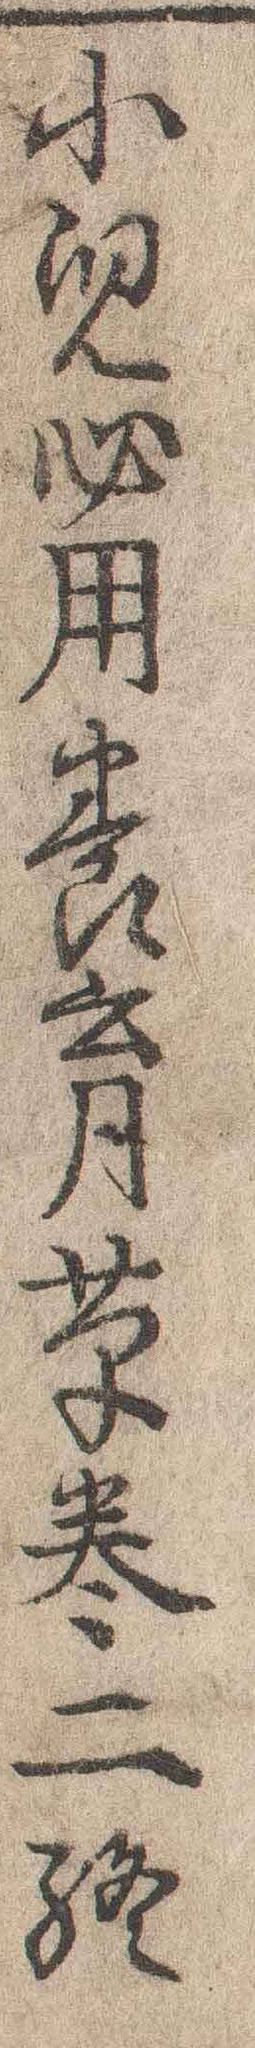小児必用養育草巻二終

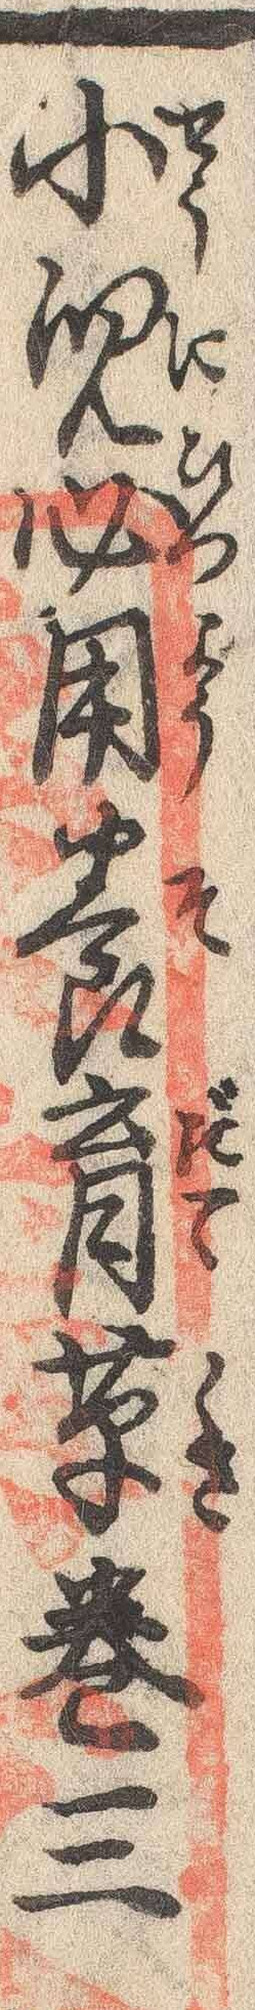小児必用養育草巻三
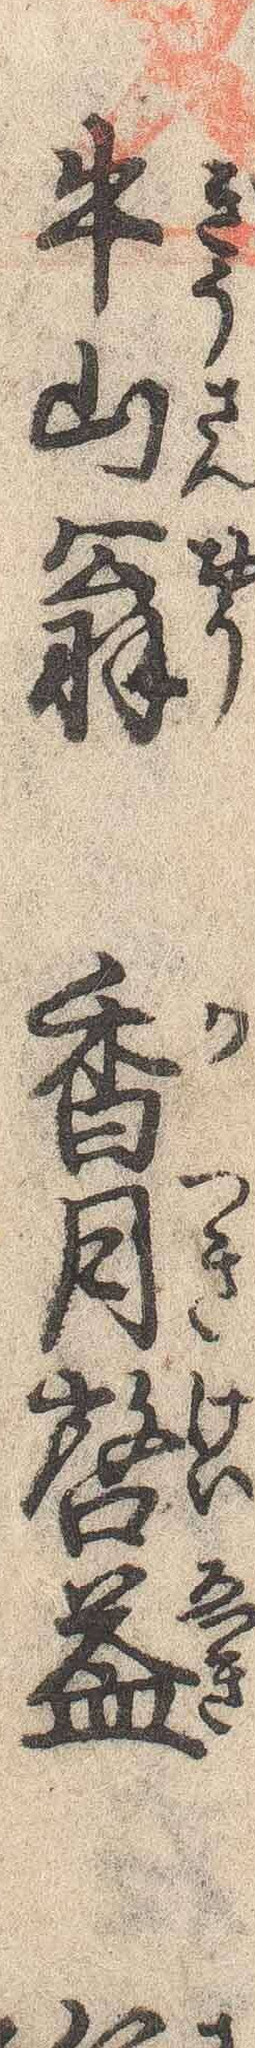牛山翁香月啓益纂
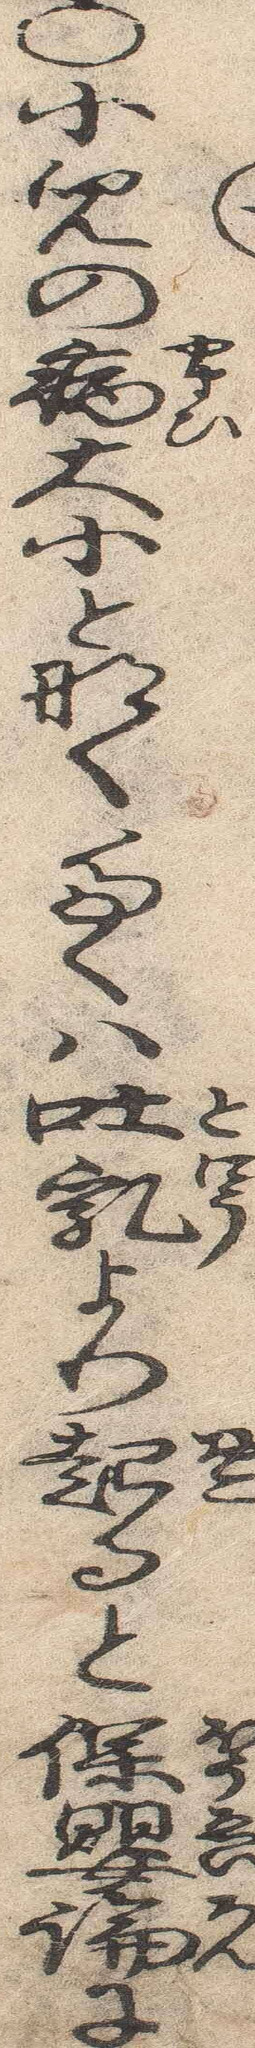○小児の病大小となく多くは吐乳より起ると保嬰論に
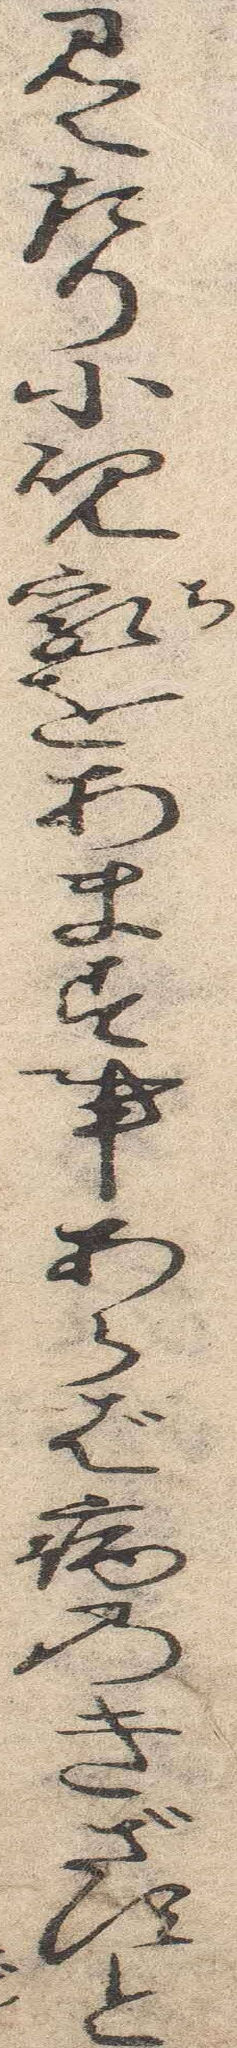見えたり小児乳をあます事あらば病のきざすと
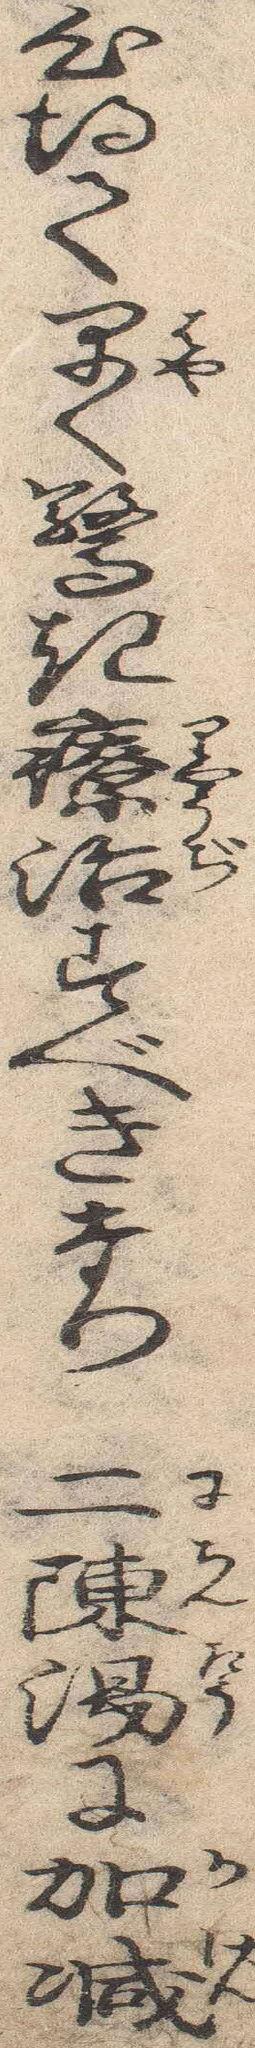心得て早く驚き療治すべきなり二陳湯に加減
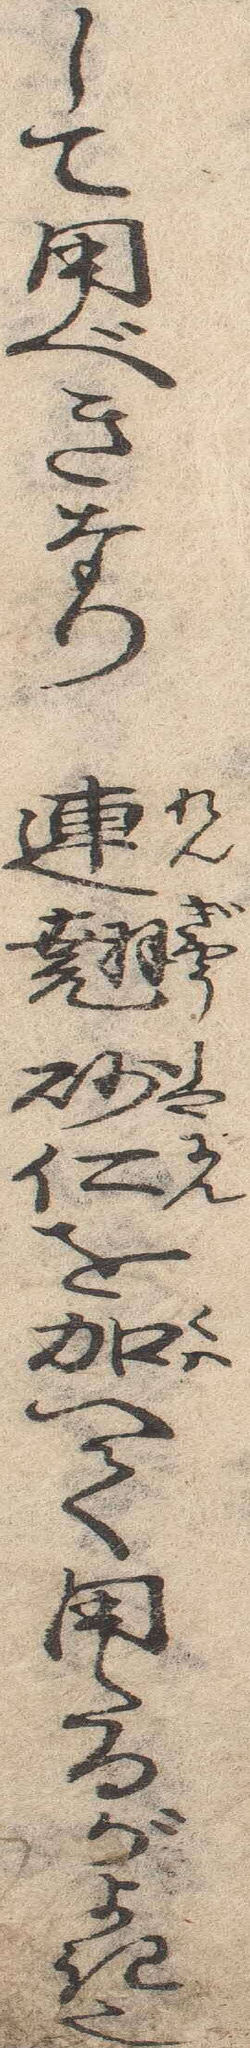して用べきなり連翹砂仁を加へて用たるがよき也
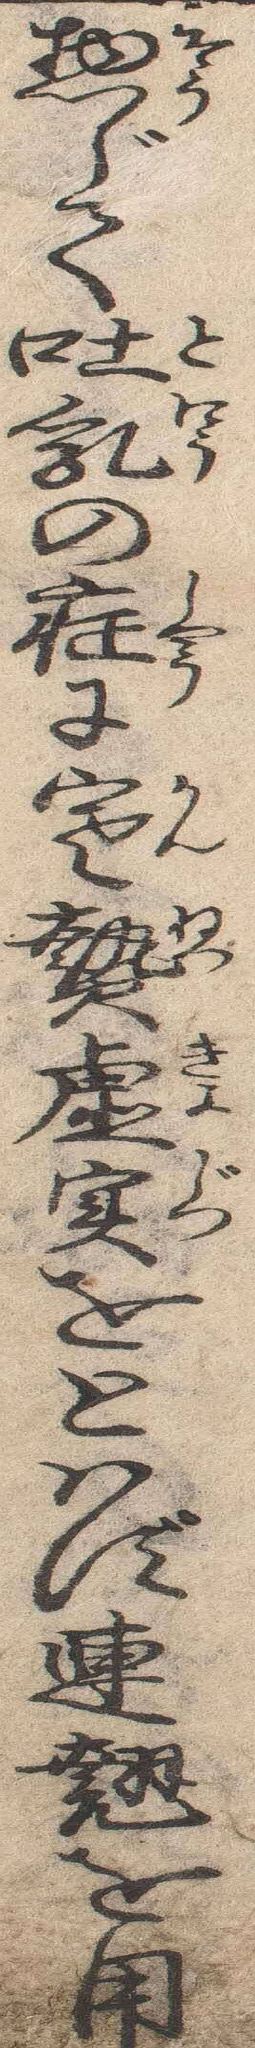総じて吐乳の症に寒熱虚実をとはず連翹を用
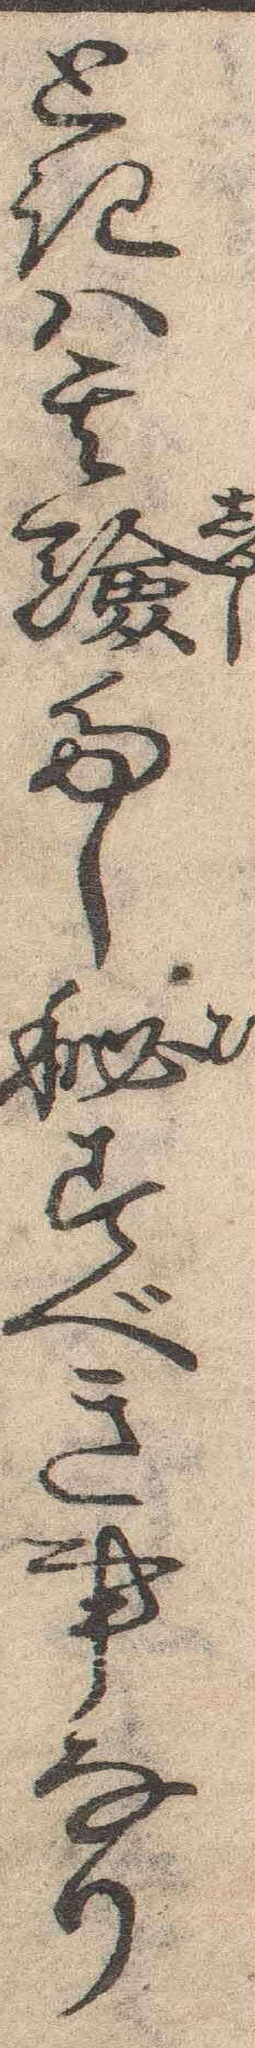ときは其験多し秘すべき事なり
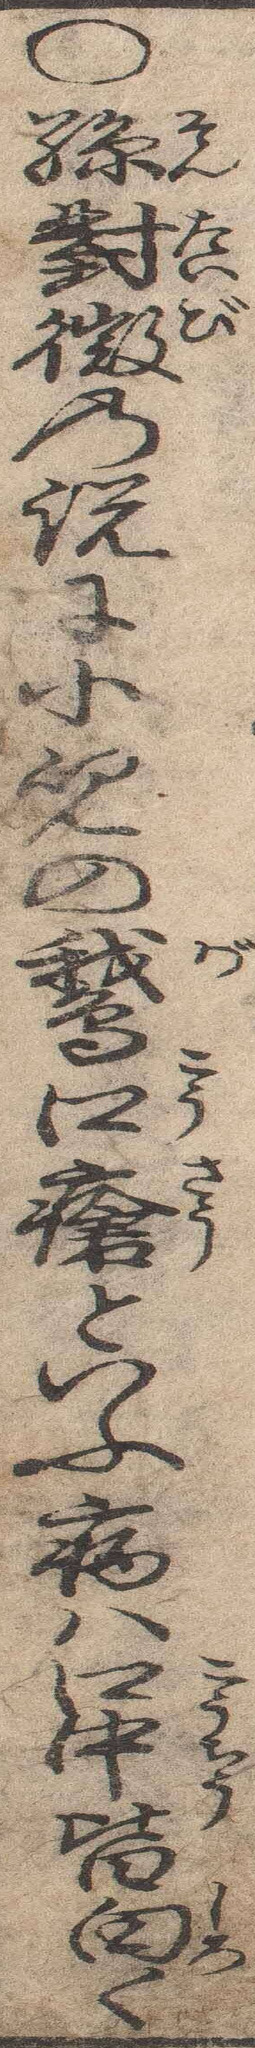○孫対微の説に小児の鵞口瘡といふ病は口中皆白く
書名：小児必用養育草
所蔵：東京学芸大学附属図書館 国文学研究資料館
